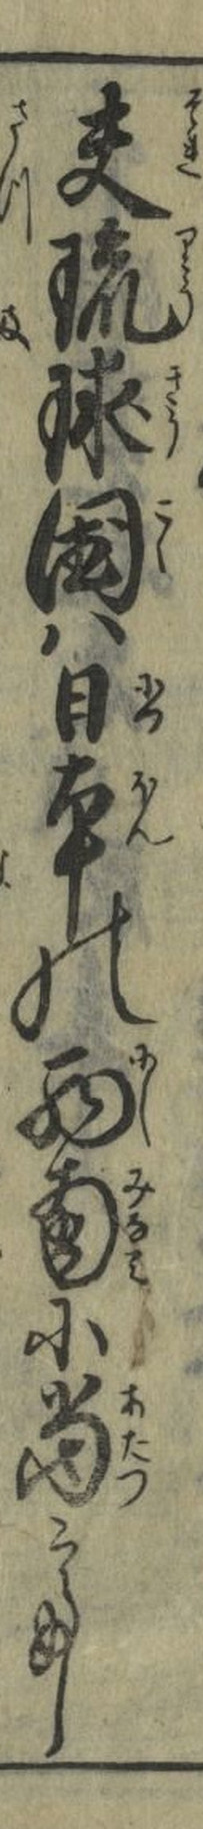夫琉球国は日本の西南に当て
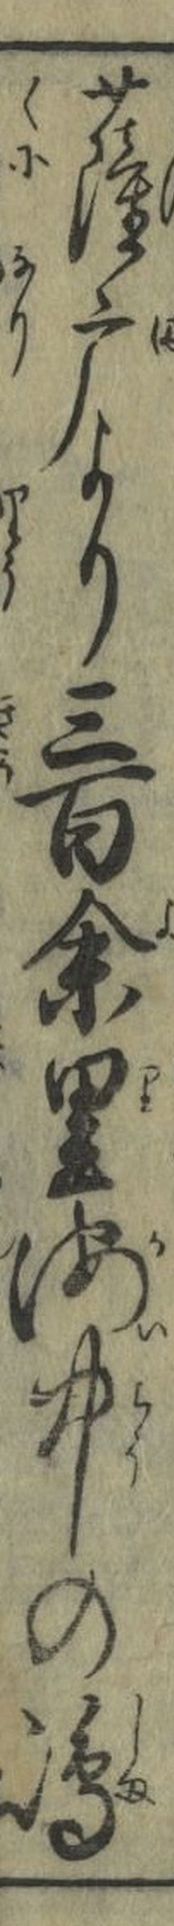薩摩より三百余里海中の嶋
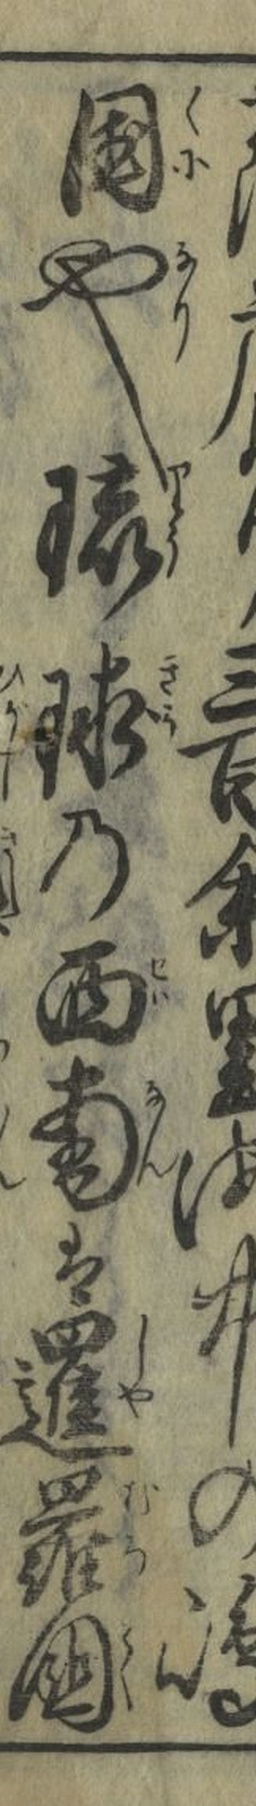国也琉球の西南は暹羅国
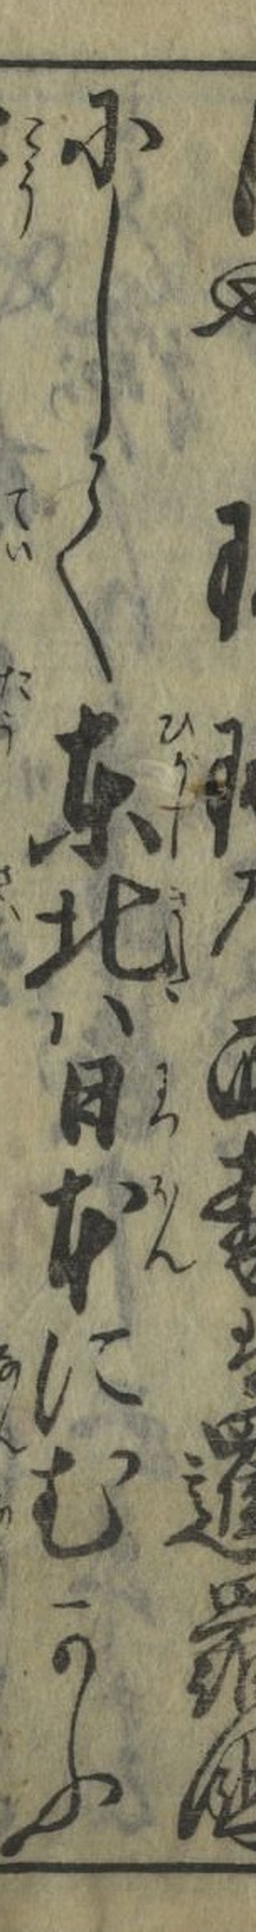にして東北は日本にむかふ
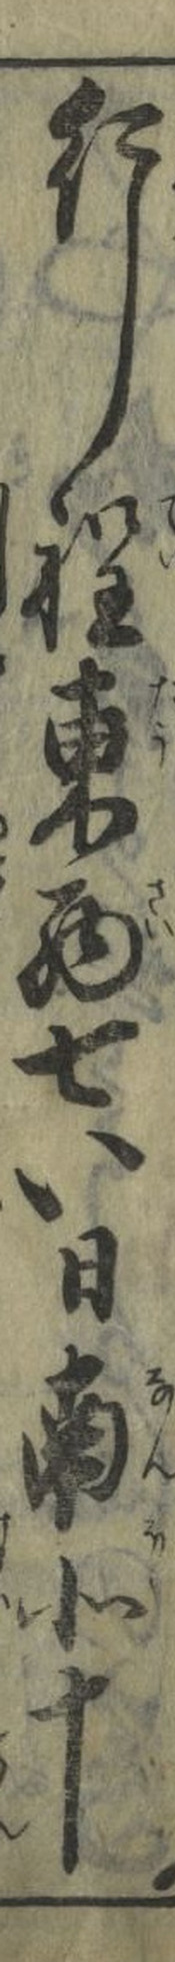行程東西七八日南北十
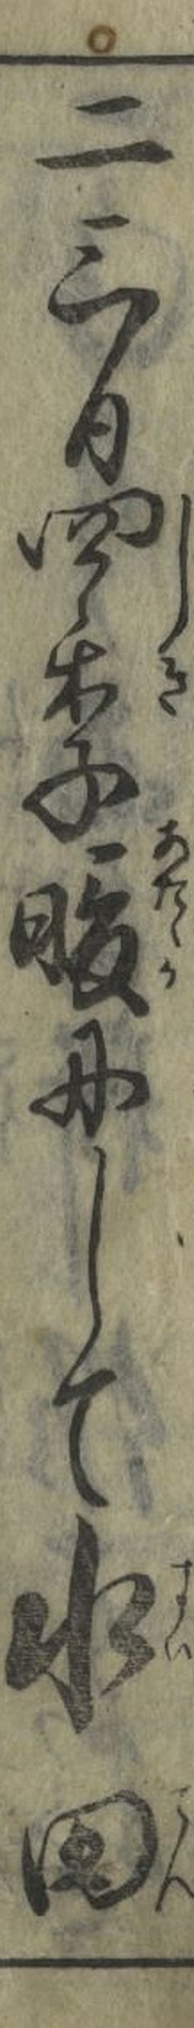二三日四季暖にして水田

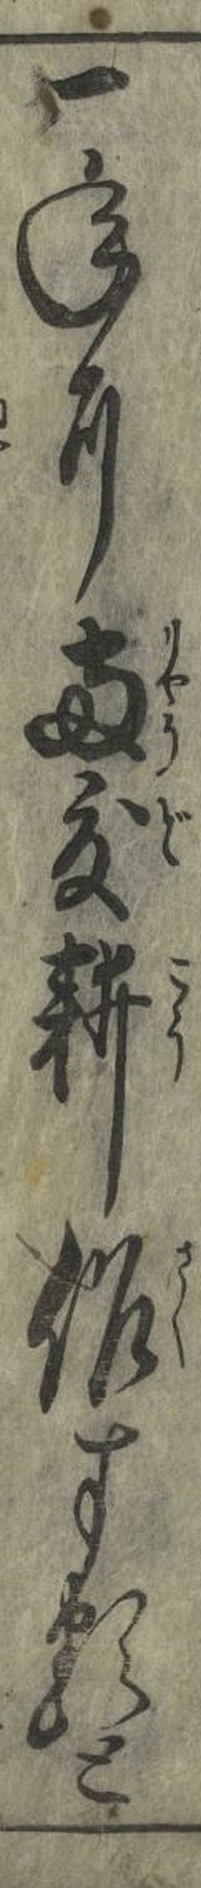一年可両度耕作すると
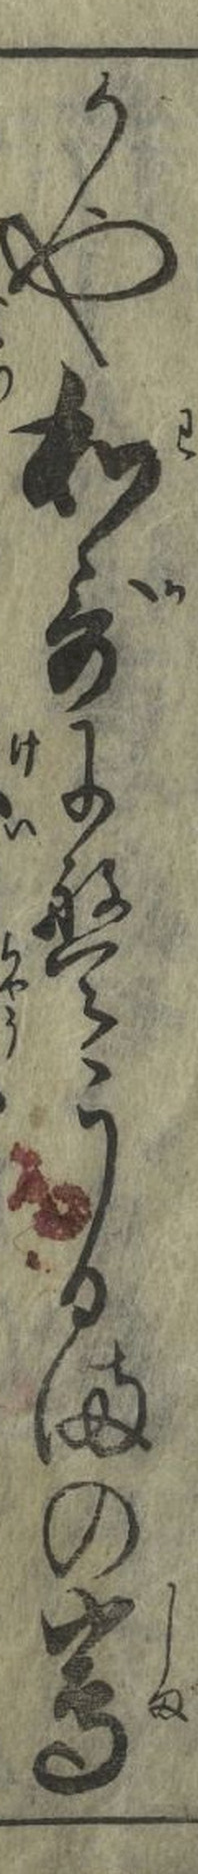かや和哥にはうるまの嶋
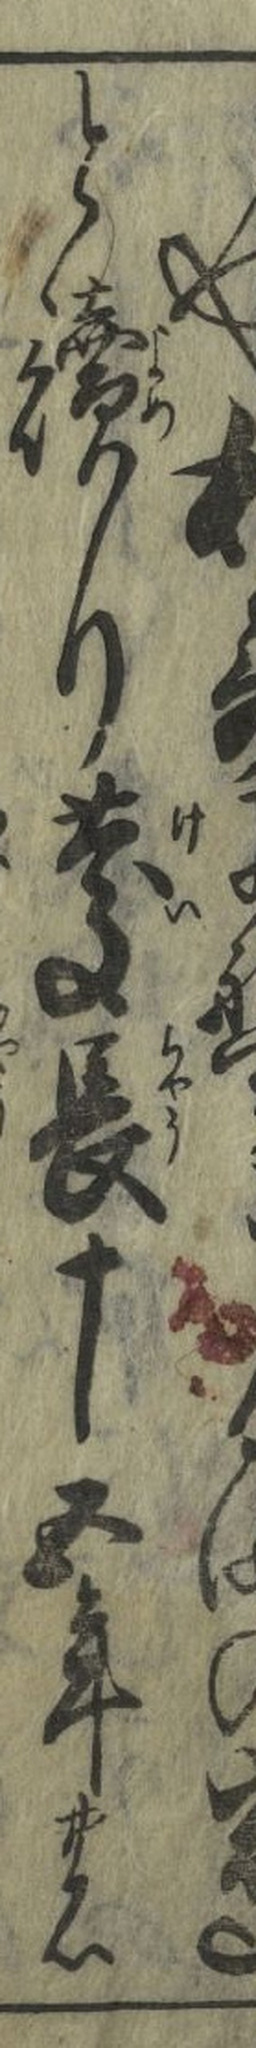と讀り慶長十五年の
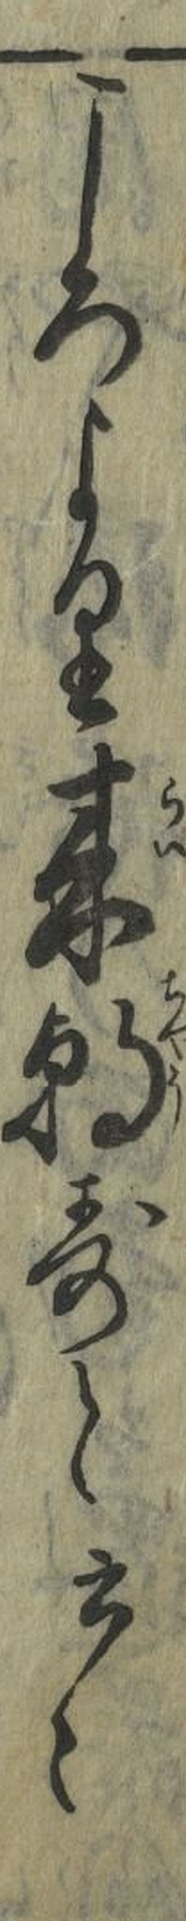ころより来朝すと云々
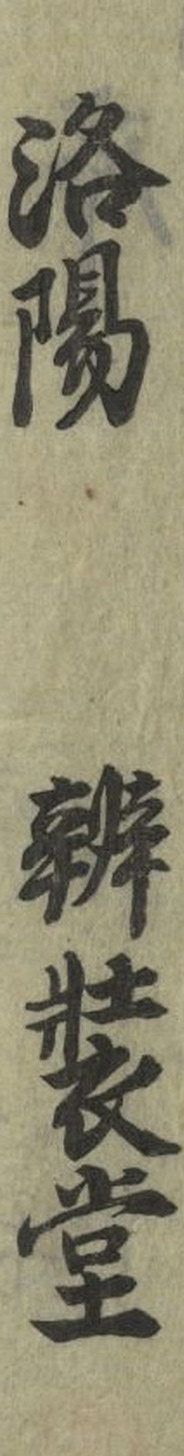洛陽辨装堂
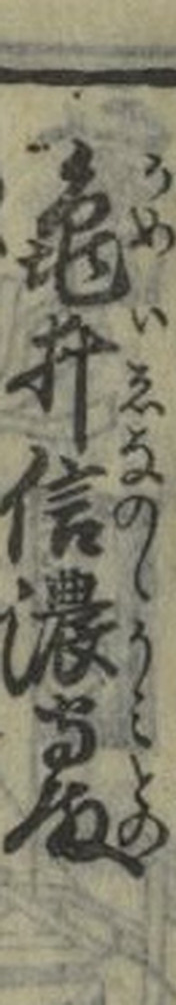亀井信濃守殿
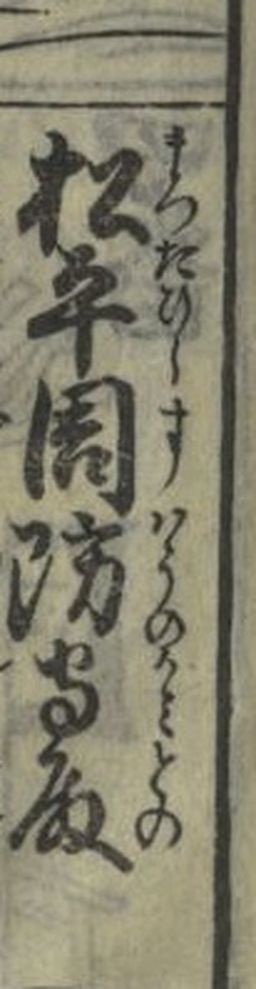松平周防守殿
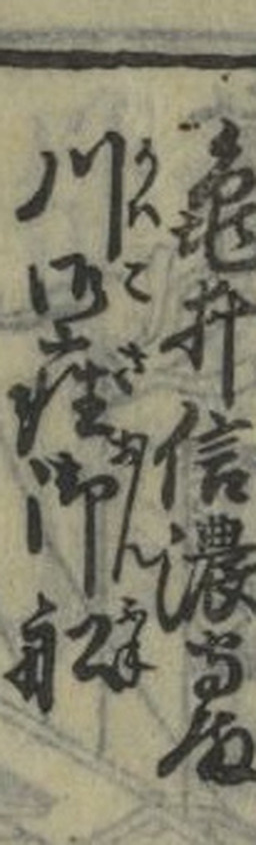川御座御船
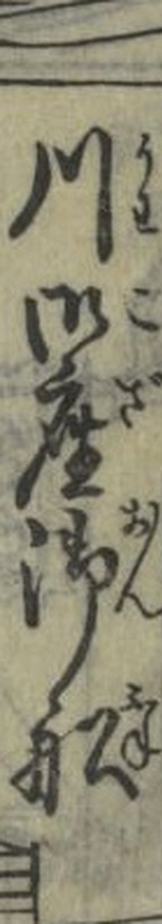川御座御船

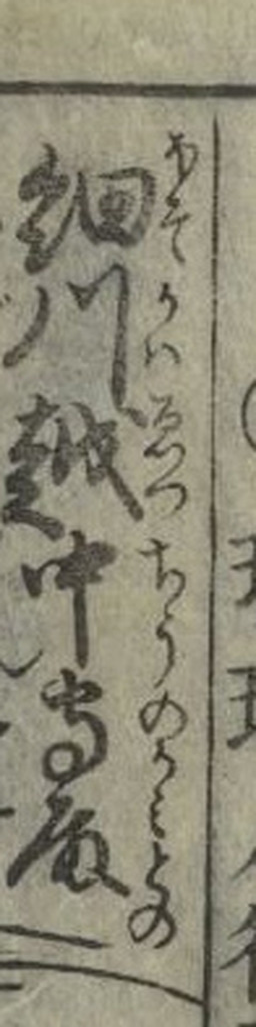細川越中守殿
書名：琉球人大行列記
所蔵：University of the Ryukyus Library
